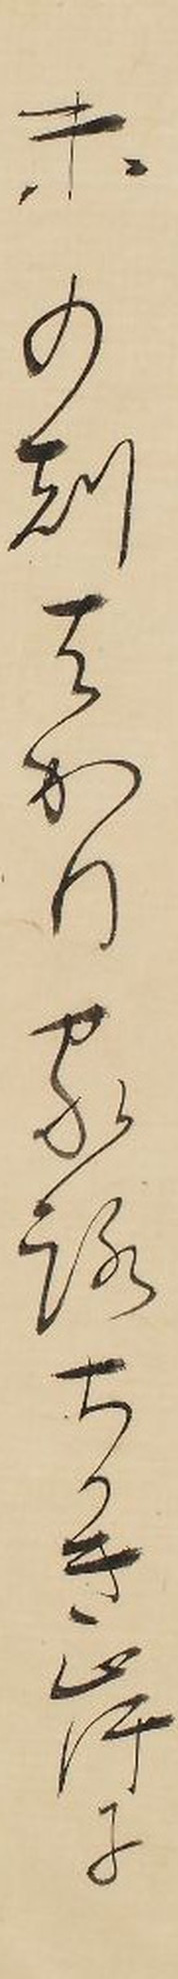未の刻はかり家路ちかき岸に
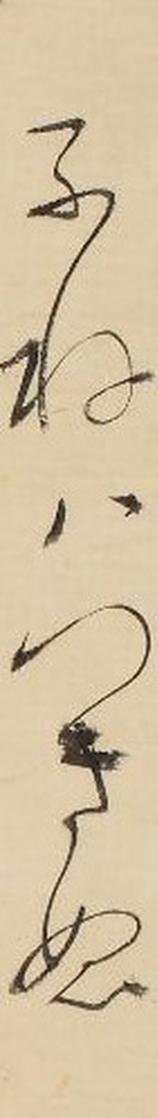ふねはつきぬ
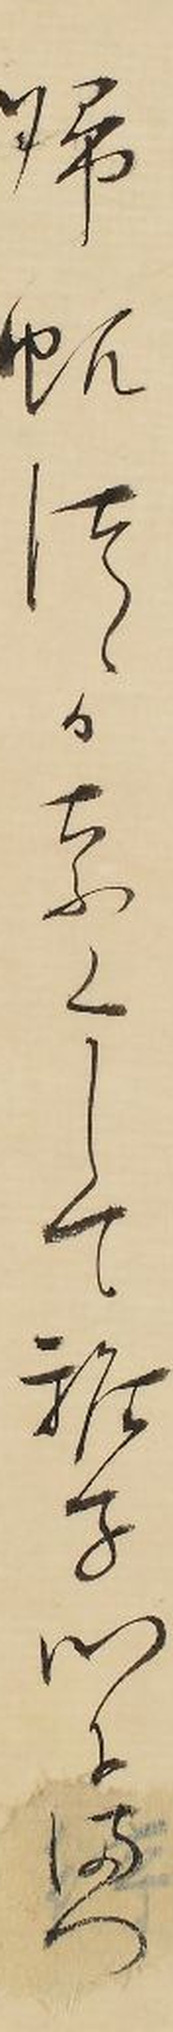帰帆つゝかなくして稚子門にまつ
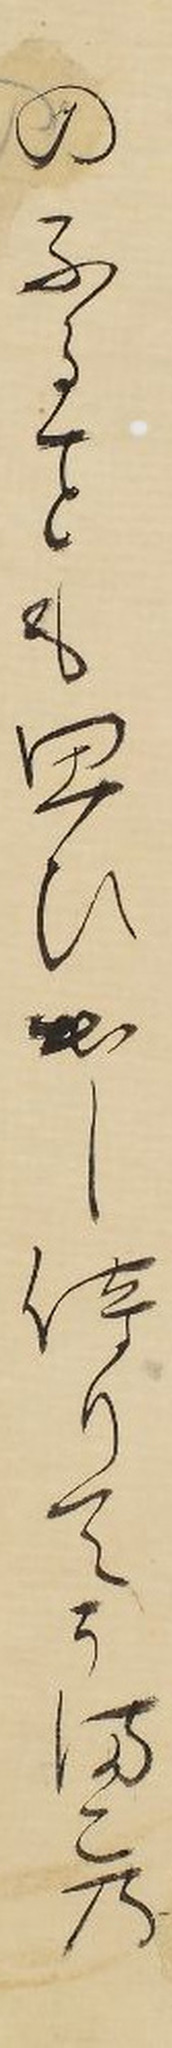のふることも思ひ出し侍りてうまこの
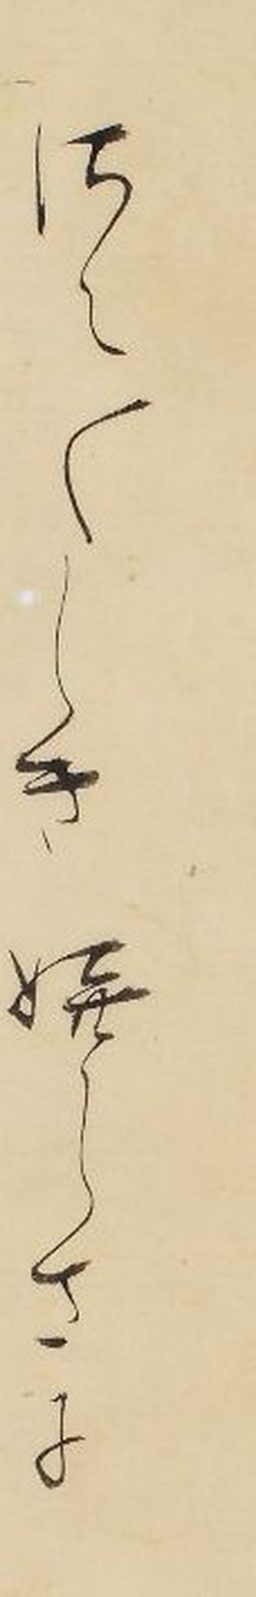さえ〳〵しき嬉しさに
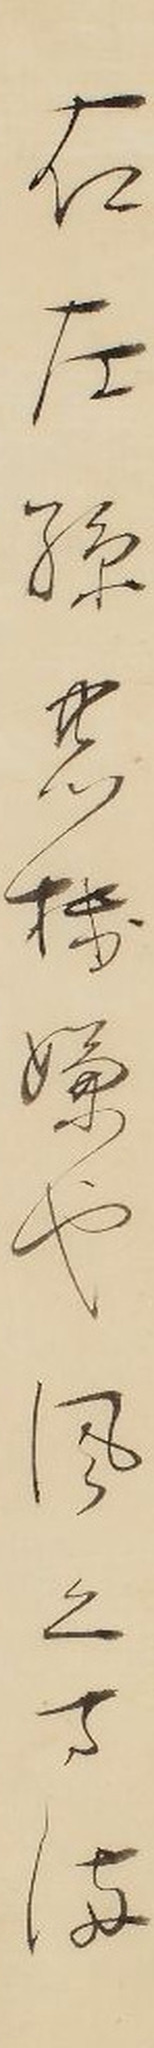右左孫の機嫌や風くるま
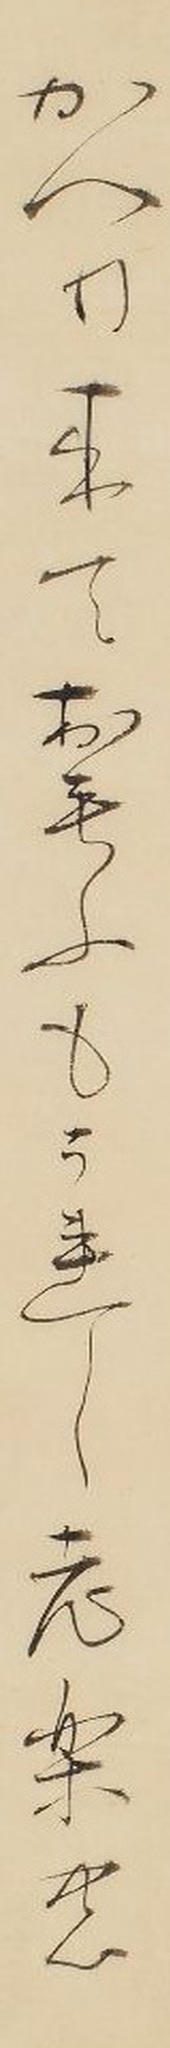かへり来ておもふもうれし老楽の
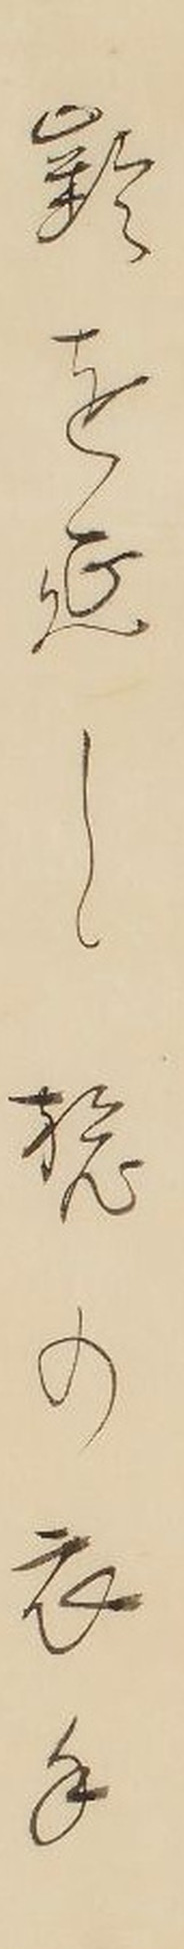齢を延しゝ旅の衣手
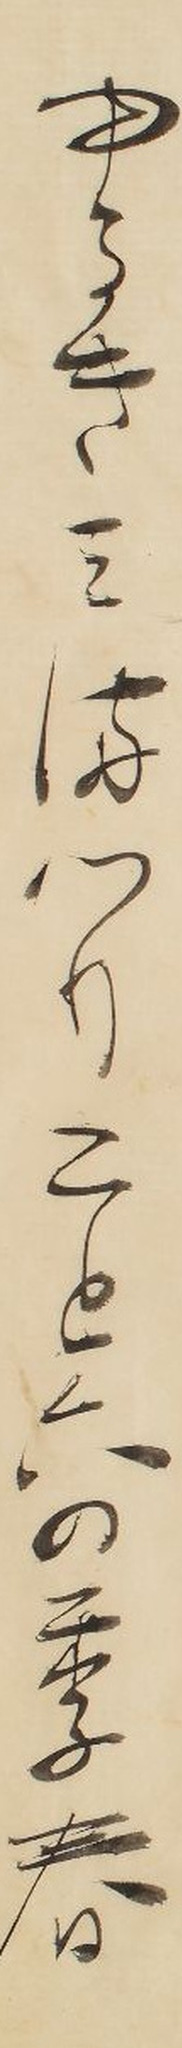ゆるきみまつりこと六の季春
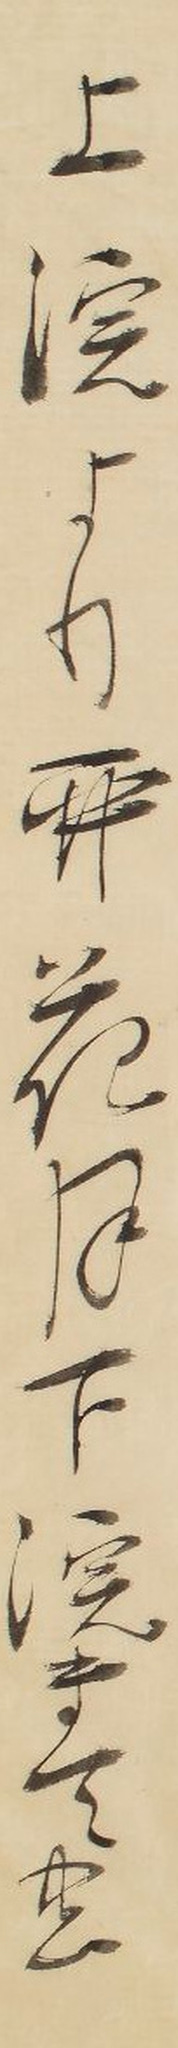上浣より開花月下浣まての

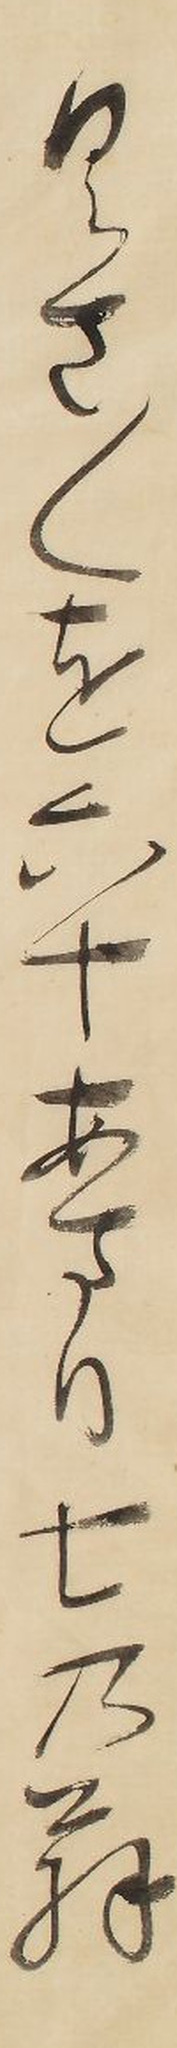くさ〳〵を六十あまり七の翁
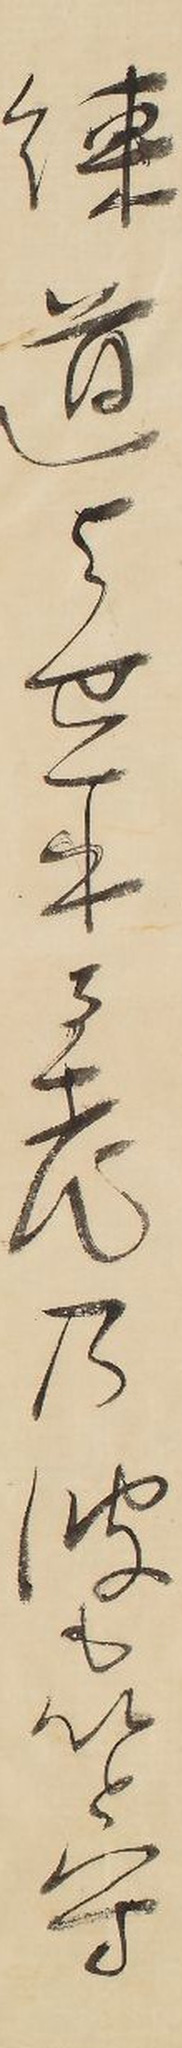練道よせ来る老の波もいとはす
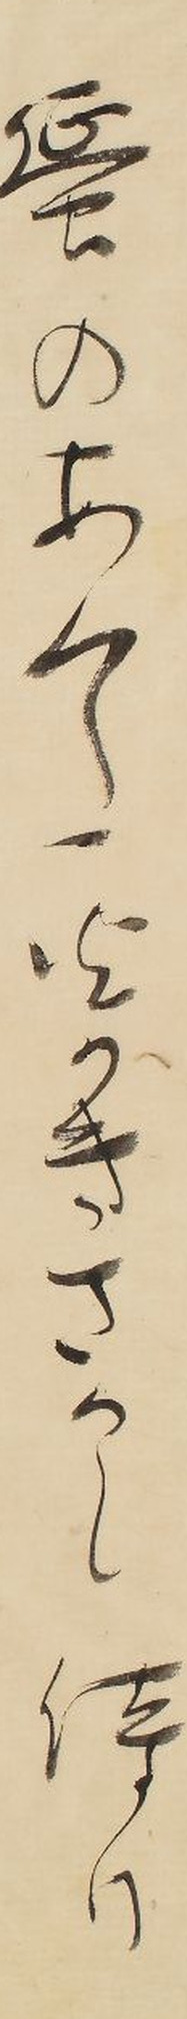蜑のあくた火かきさかし侍り
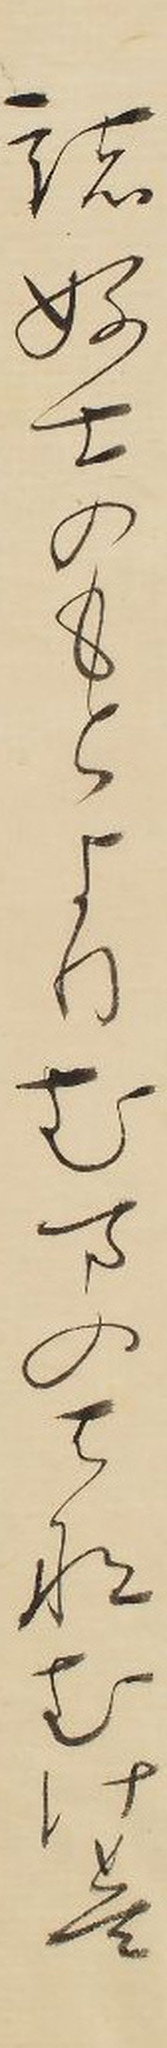諸好子のもとよりむまのはなむけとて
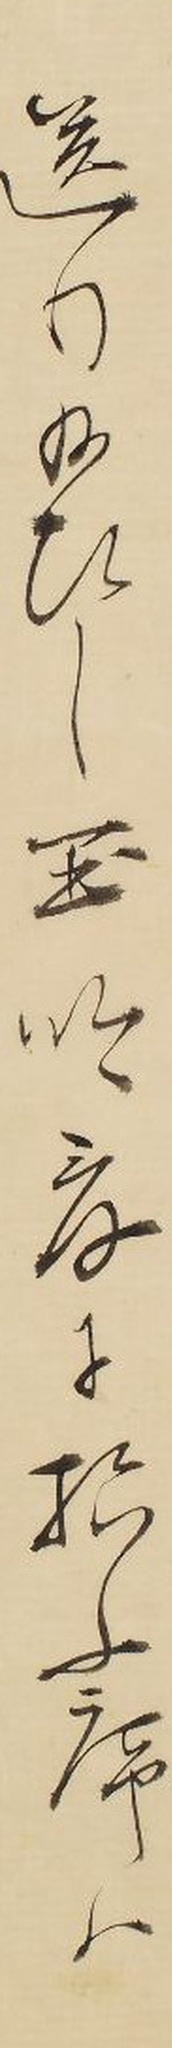送り給ひし玉吟爰に拾う席は
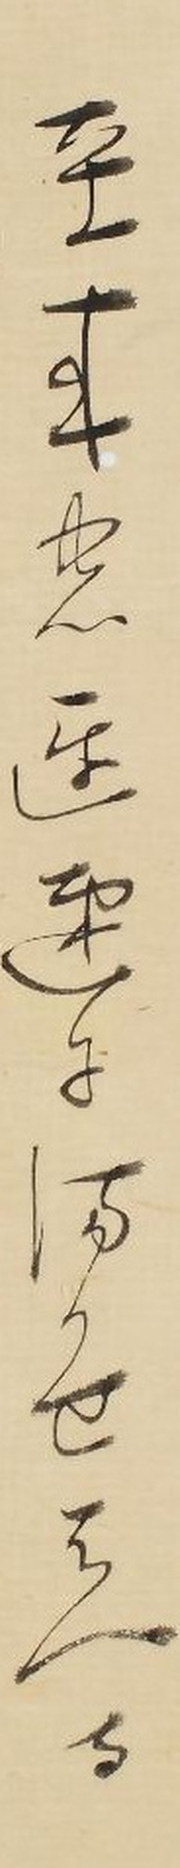至来の遅速にまかせはへる
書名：花土産
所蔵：徳島県立図書館
